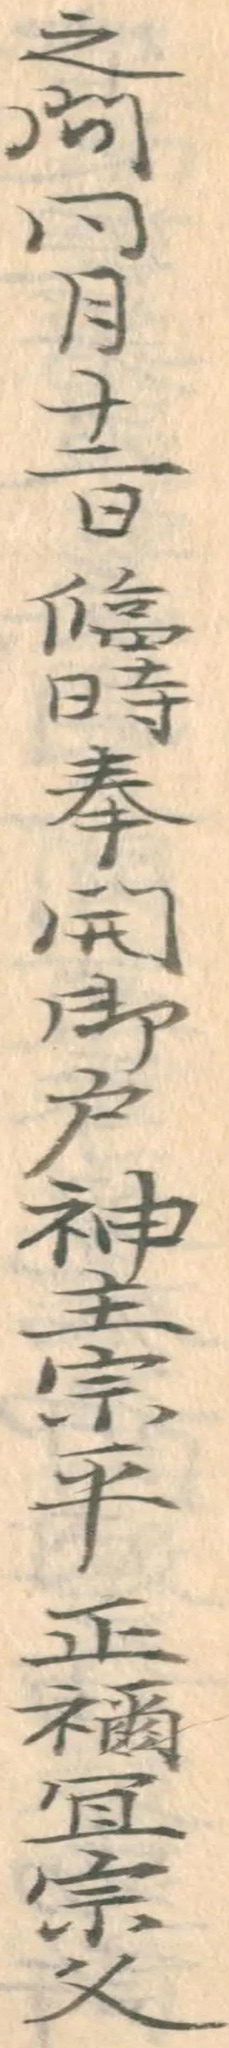之間同月十二日臨時奉開御戸神主宗平正祢宜宗久
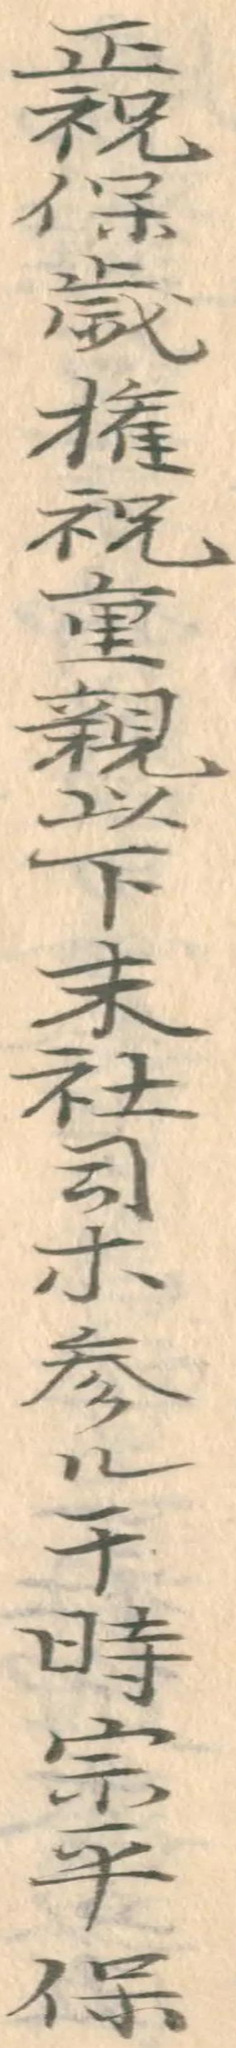正祝保歳権祝重親以下末社司等参ル于時宗平保
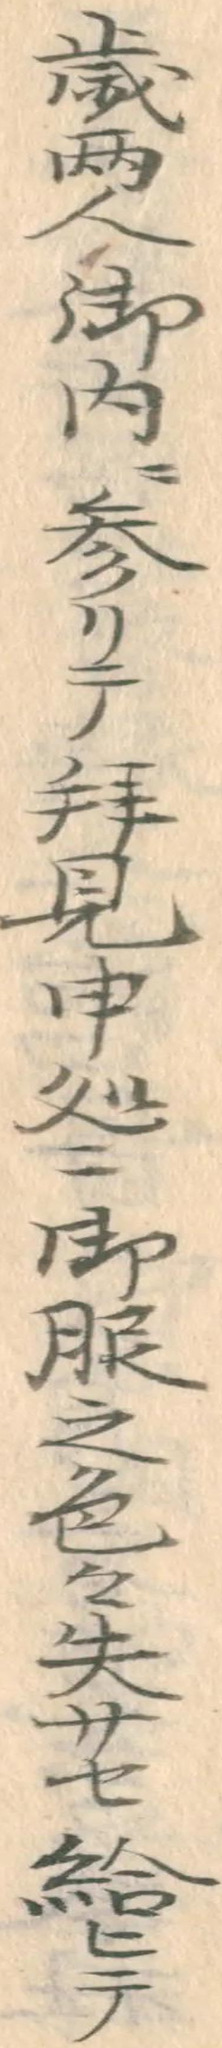歳両人御内ニ参リテ拝見申処ニ御服之色々失サセ給ヒテ
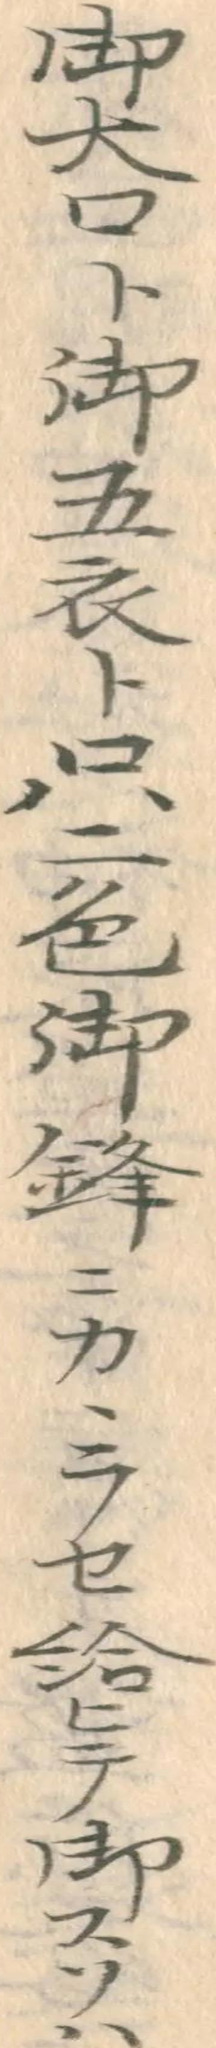御大口ト御五衣ト只二色御鋒ニカヽラセ給ヒテ御スソハ
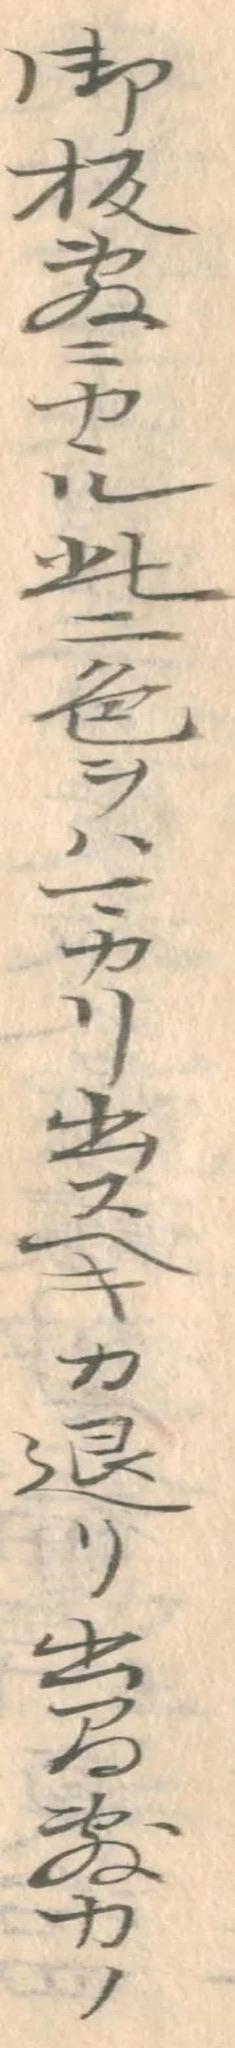御板敷ニカヽル此二色ヲハマカリ出スヘキカ退リ出間敷カノ
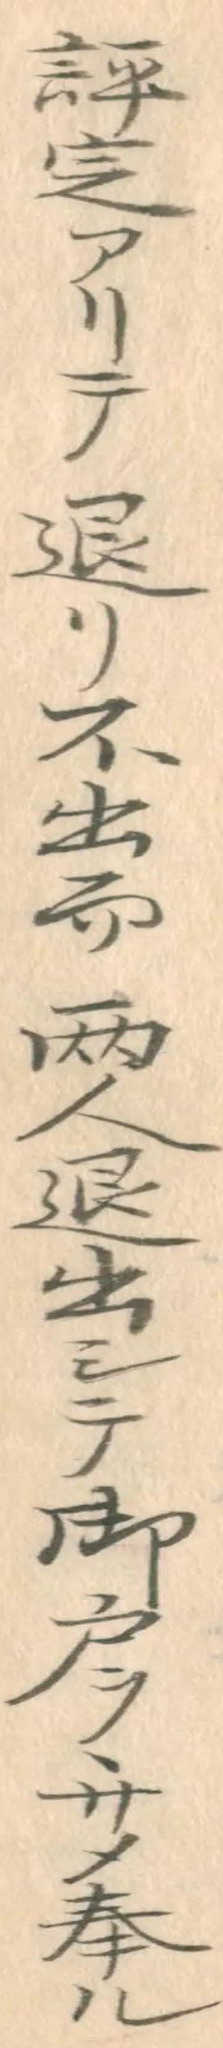評定アリテ退リ不出而両人退出シテ御戸ヲヽサメ奉ル
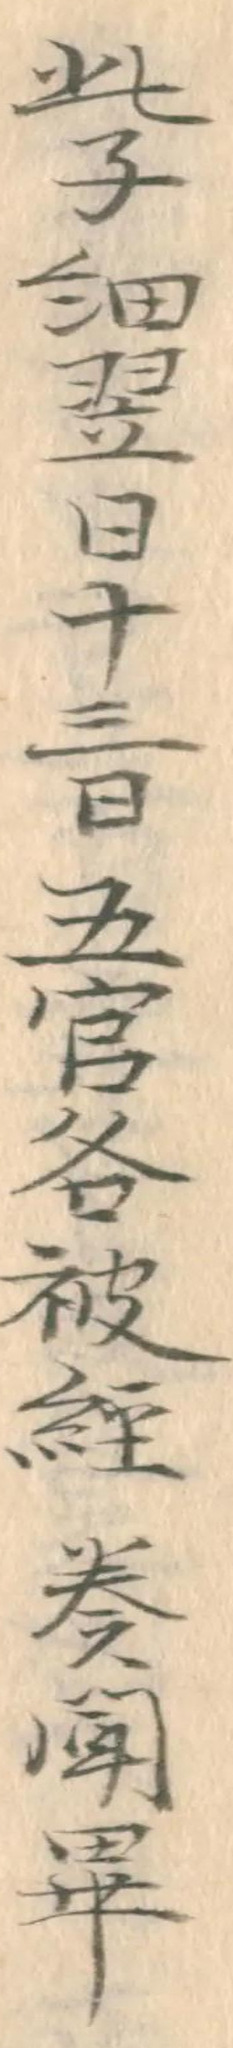此子細翌日十三日五官各被経奏聞畢
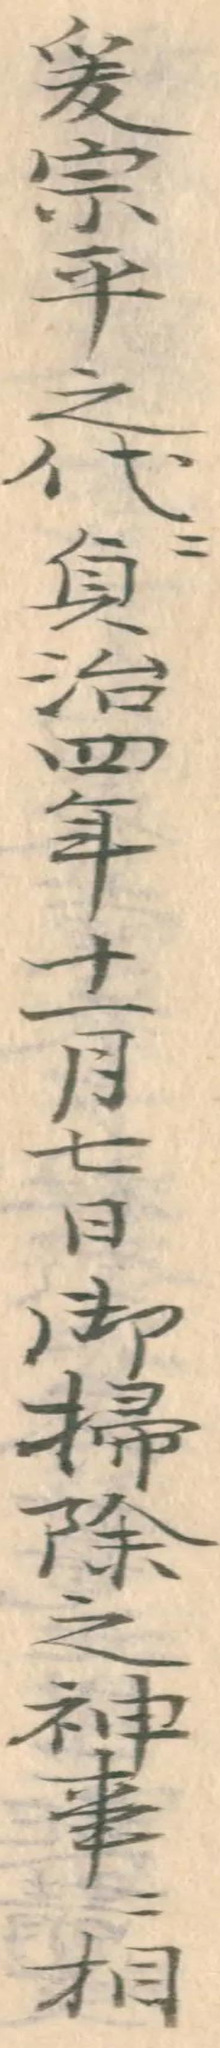爰宗平之代ニ貞治四年十一月七日御掃除之神事ニ相
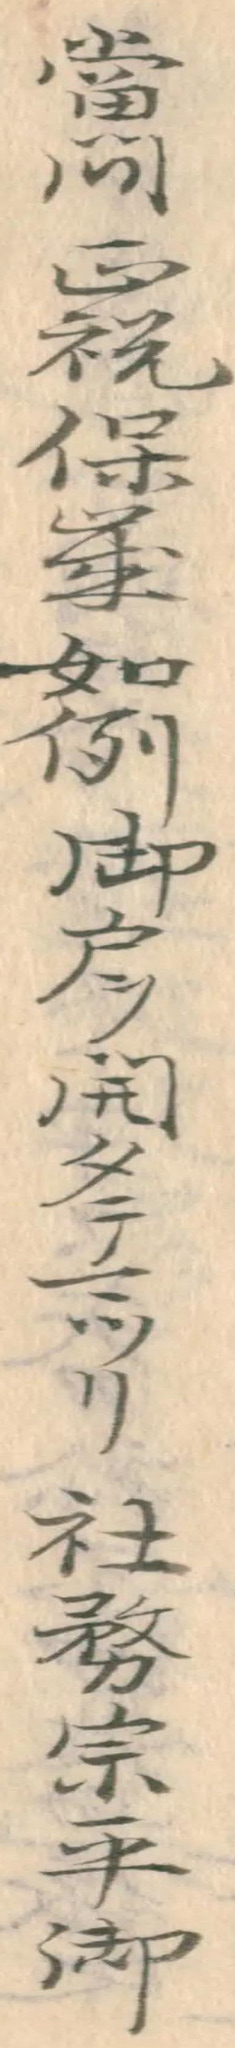当問正祝保歳如例御戸ヲ開タテマツリ社務宗平御
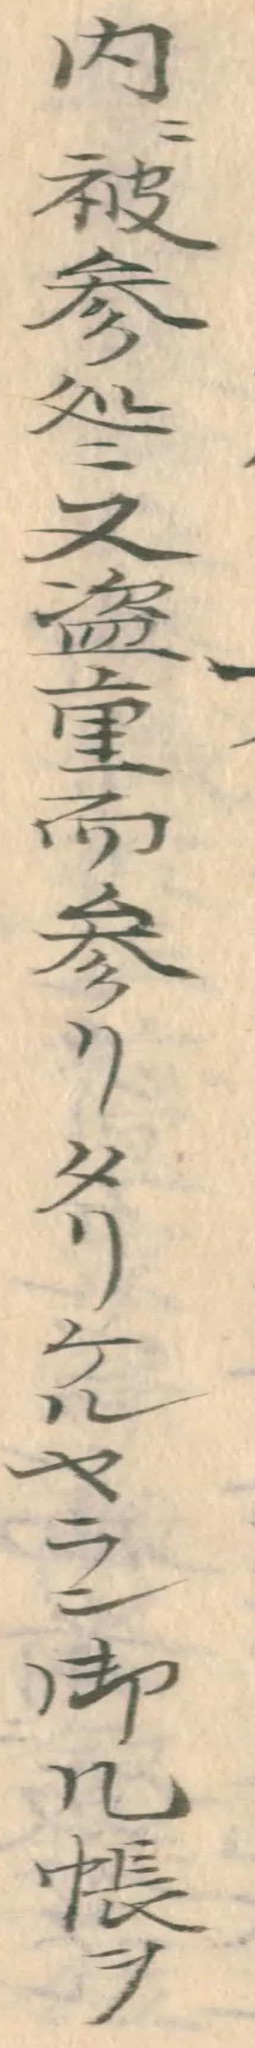内ニ被参処ニ又盗重而参リタリケルヤラン御几帳ヲ
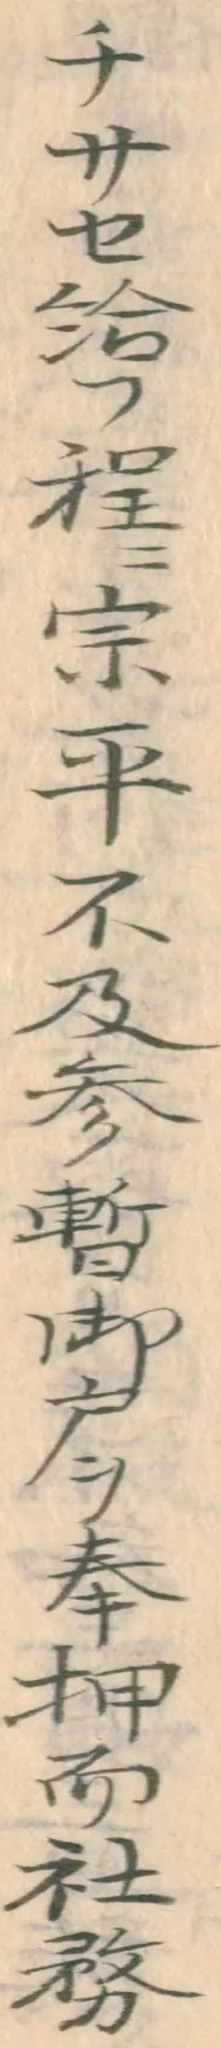チサセ給フ程ニ宗平不及参暫御戸ヲ奉押而社務
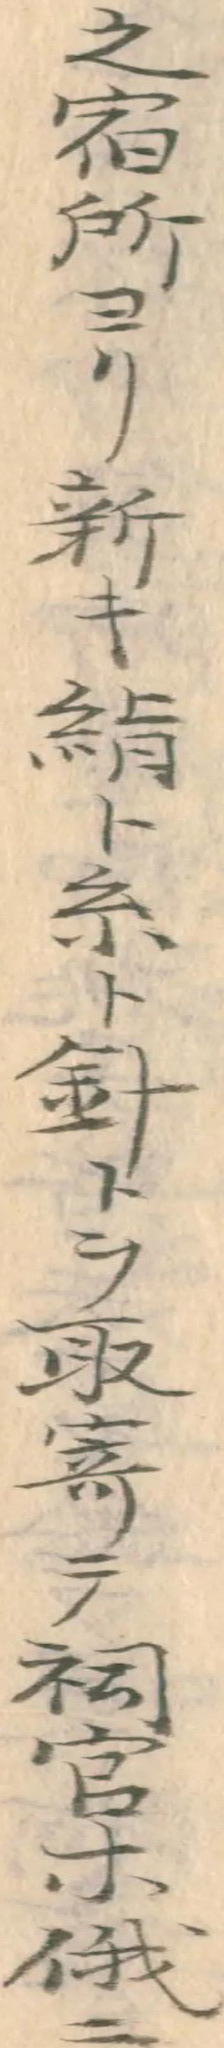之宿所ヨリ新キ絹ト糸ト針トヲ取寄テ祠官等俄ニ
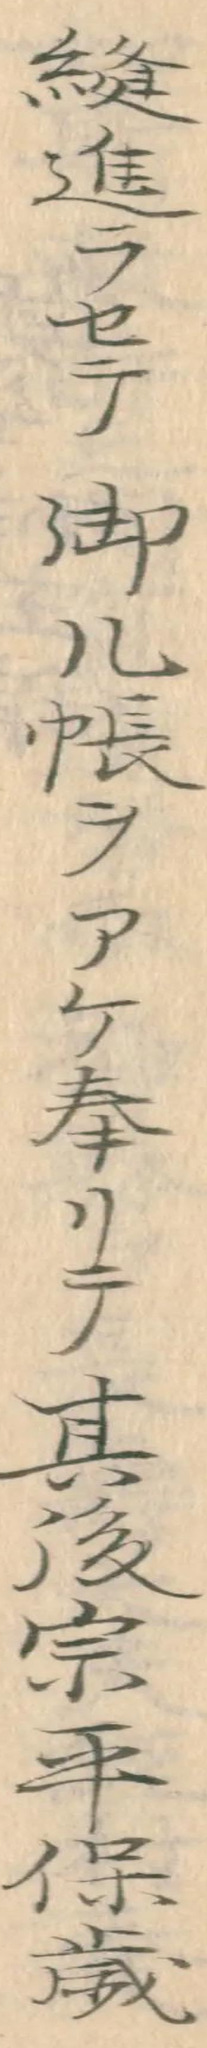縫進ラセテ御几帳ヲアケ奉リテ其後宗平保歳
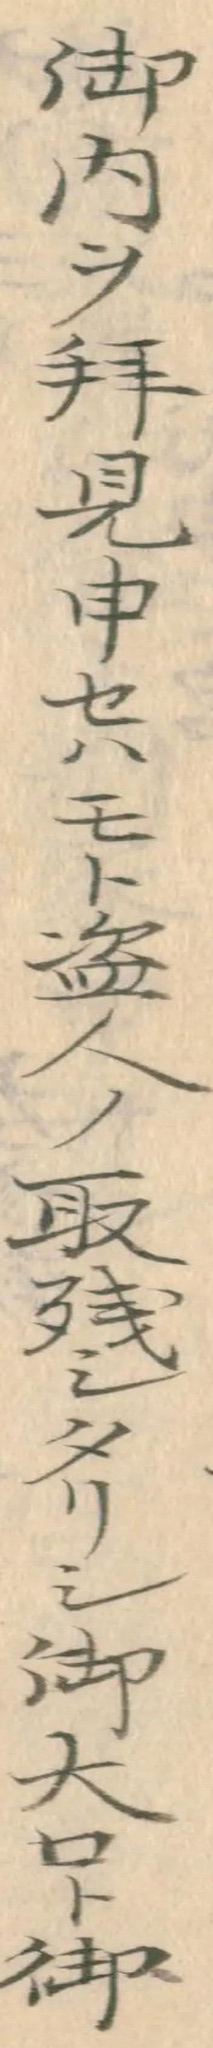御内ヲ拝見申セハモト盗人ノ取残シタリシ御大口ト御
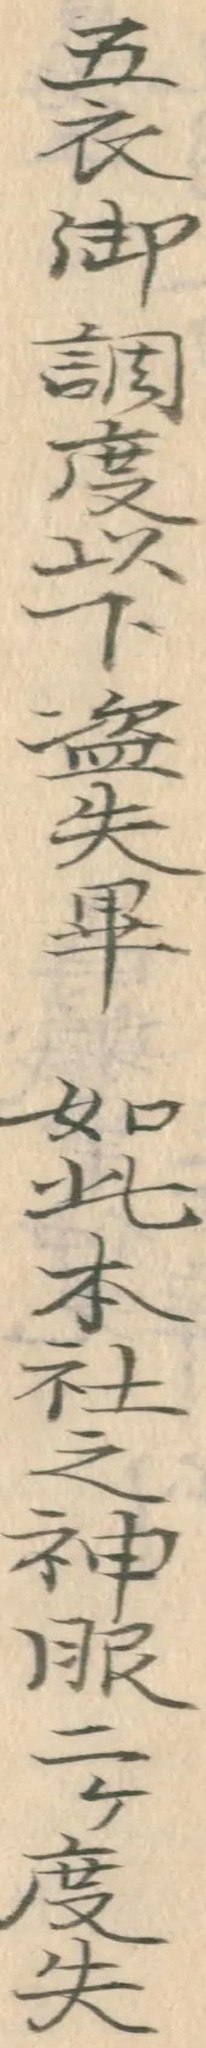五衣御調度以下盗失畢如此本社之神服二ケ度失
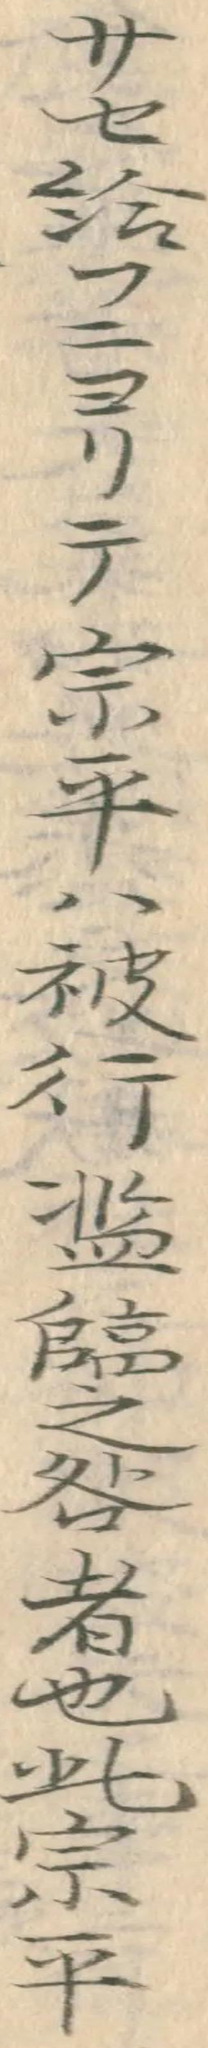サセ給フニヨリテ宗平ハ被行濫臨之咎者也此宗平
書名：賀茂社記録. 第24冊
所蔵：国立国会図書館 National Diet Library, JAPAN
